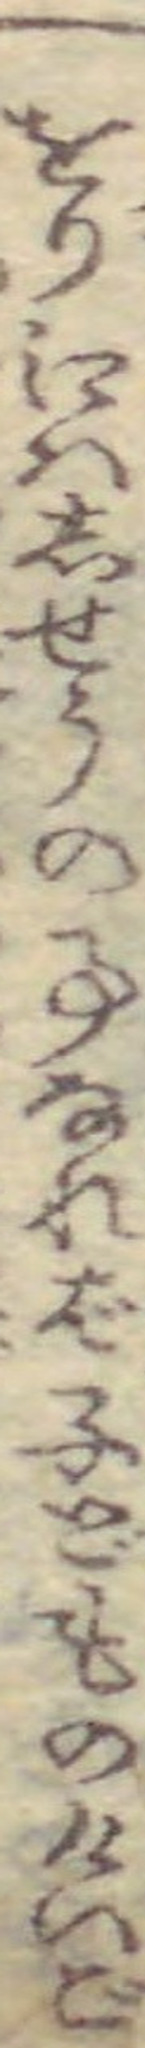をり江はしせうの事なれば子どものけいご
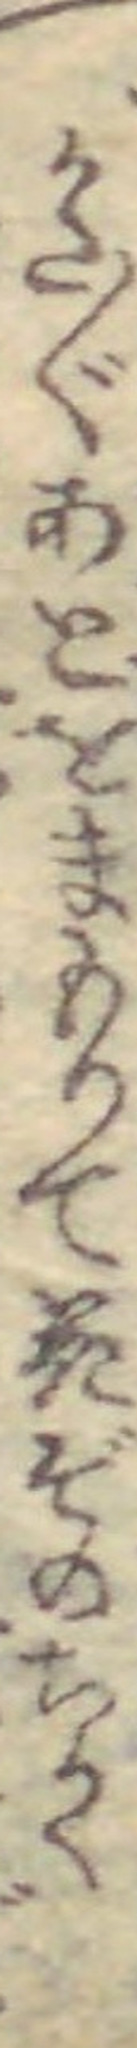かた〴〵あとをまもりて花ぞのちかく
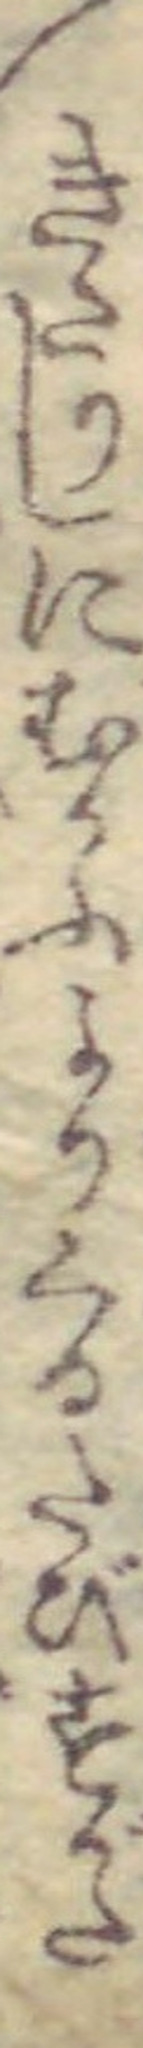きたりしにむかふよりくるたびすがた
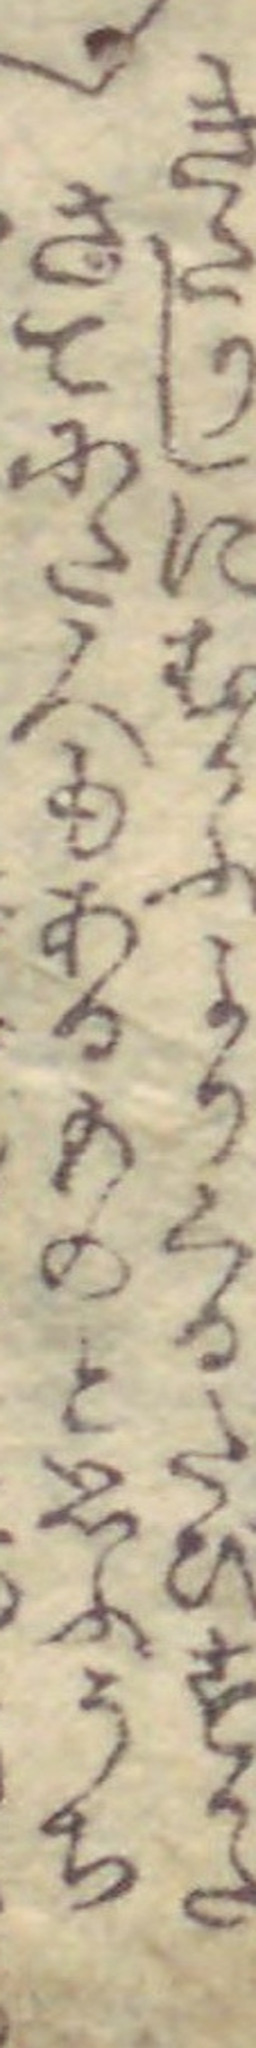さてにた人もあるものと思ふうち
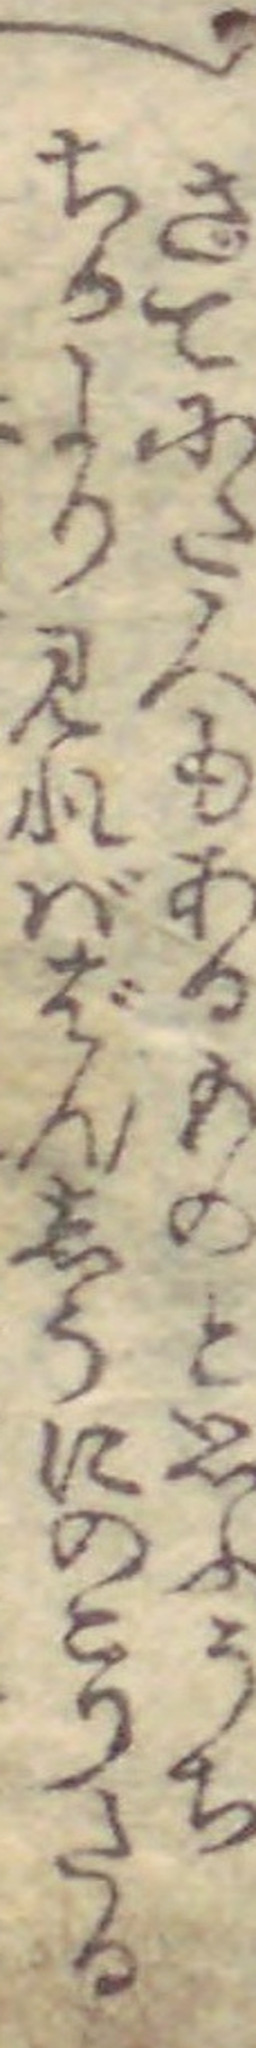ちかより見ればばんしうにのこりたる
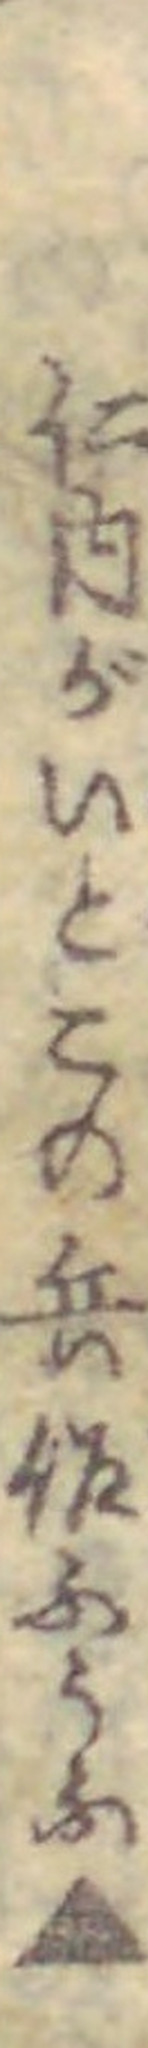仁内がいとこの兵作ふうふ▲

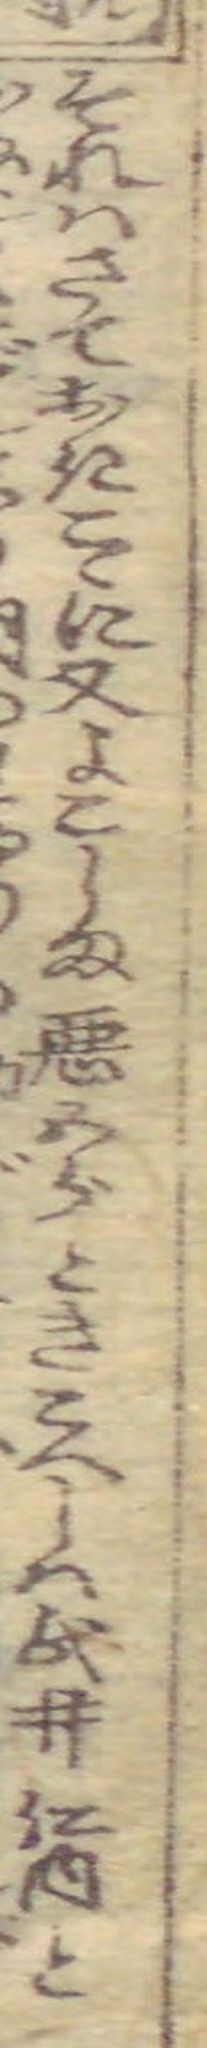それはさておきこゝに又よこしま悪五郎ときこへしは氏井仁内と
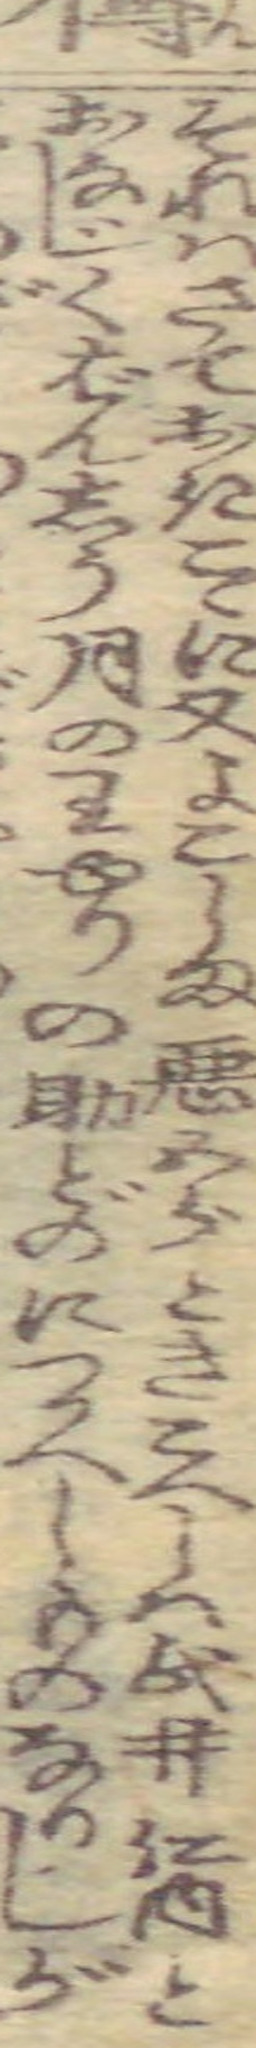おなじくばんしう月のわゆりの助どのにつかへしものなりしが
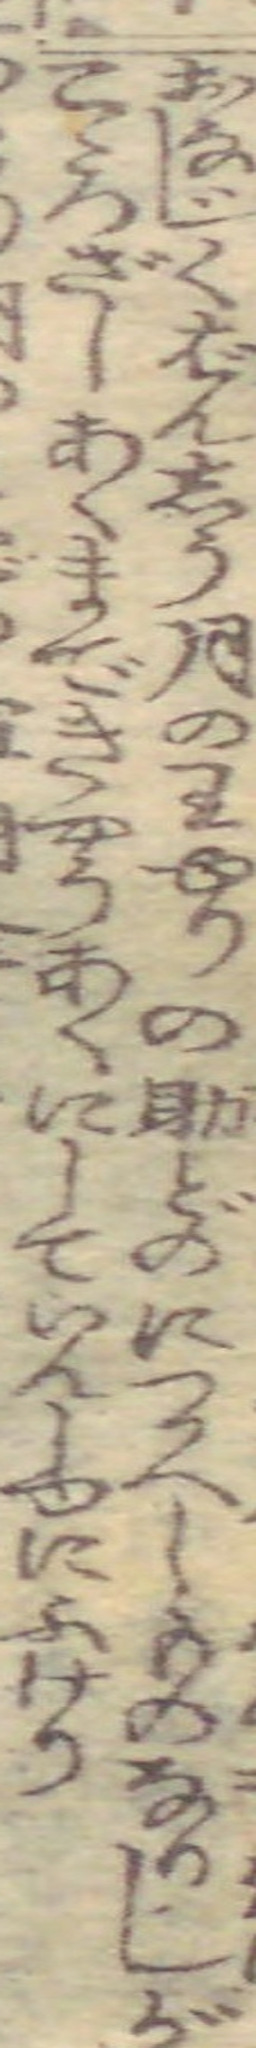こゝろざしあくまできやうあくにしていんしゆにふけり
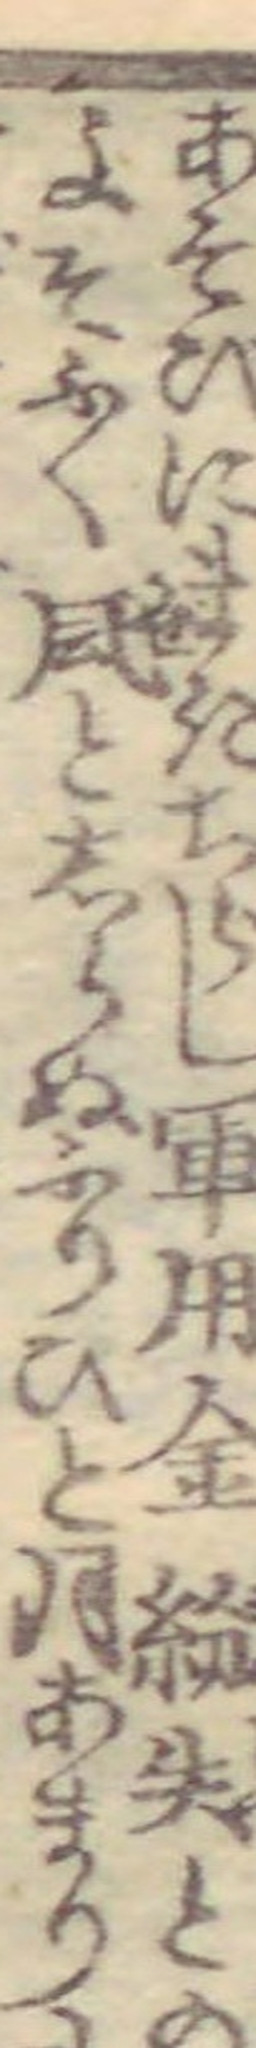よそふく風としらぬふりひと月あまりも
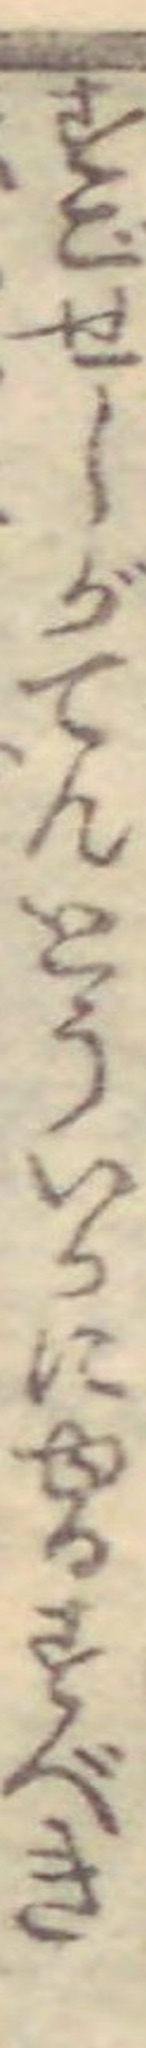すごせしがてんとういかにゆるすべき
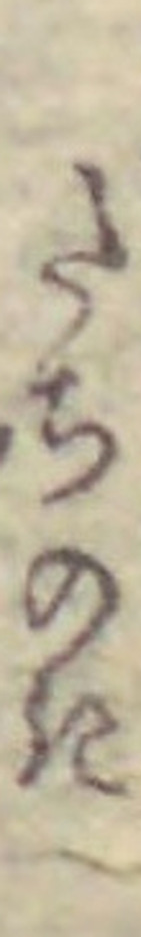たちのき
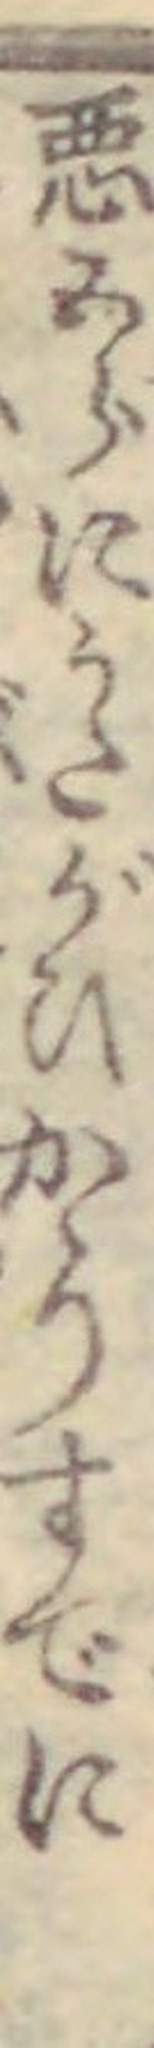悪五郎にうたがひかゝりすでに
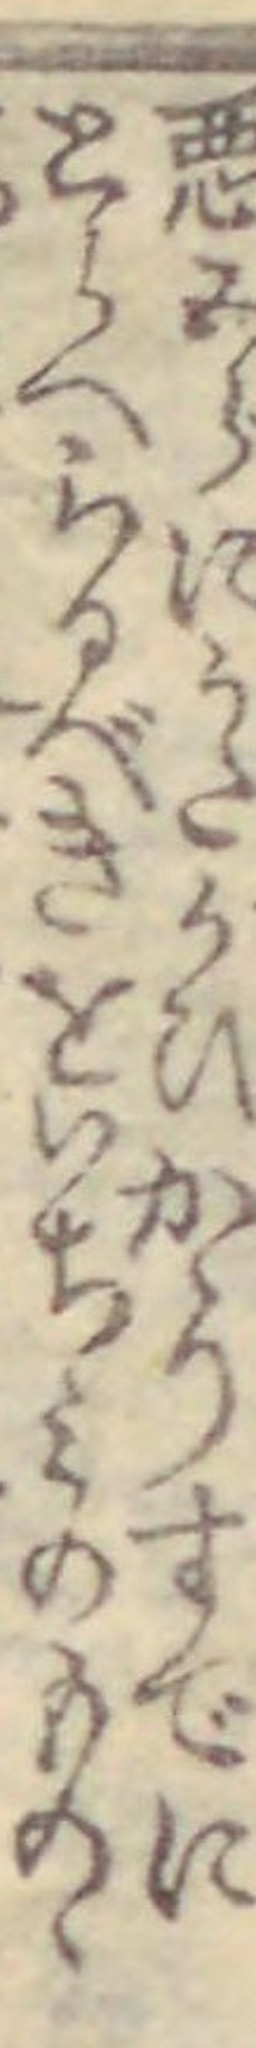とらへらるべきをいちみのものゝ
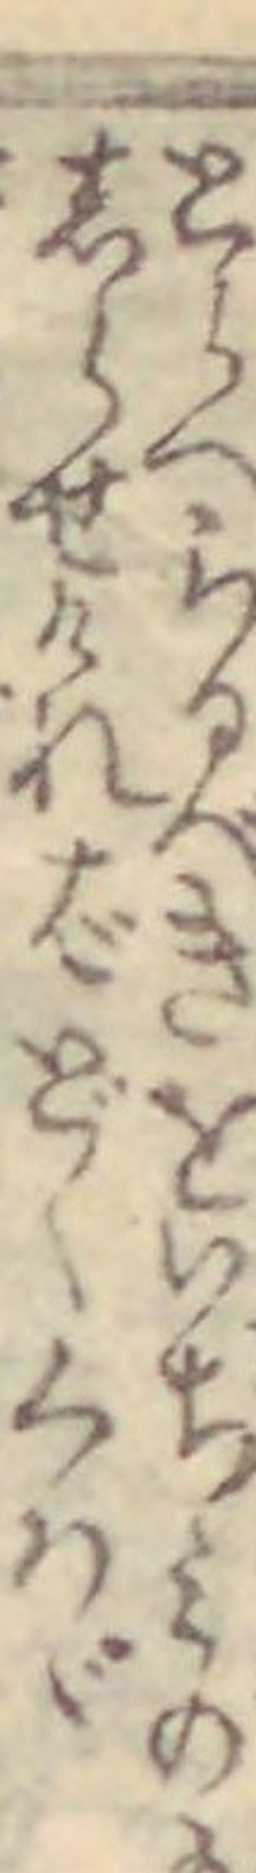しらせければどくくはゞ
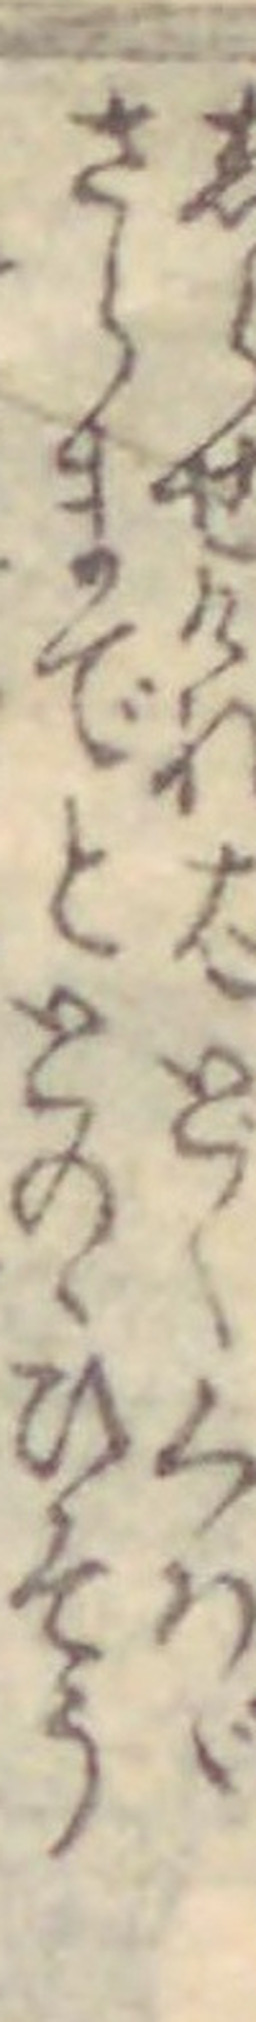さらまでととのゝひそう
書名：八ツ目鱣因縁物語 3巻
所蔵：国立国会図書館 National Diet Library, JAPAN
